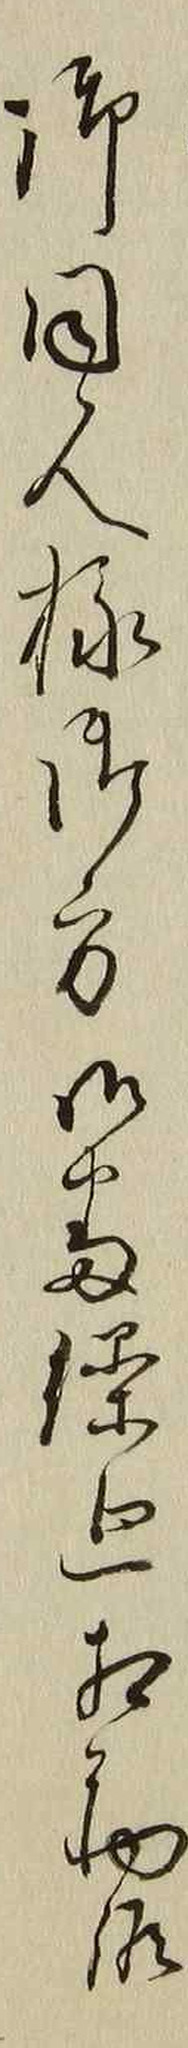御同人様御方御番繰廻相勤候
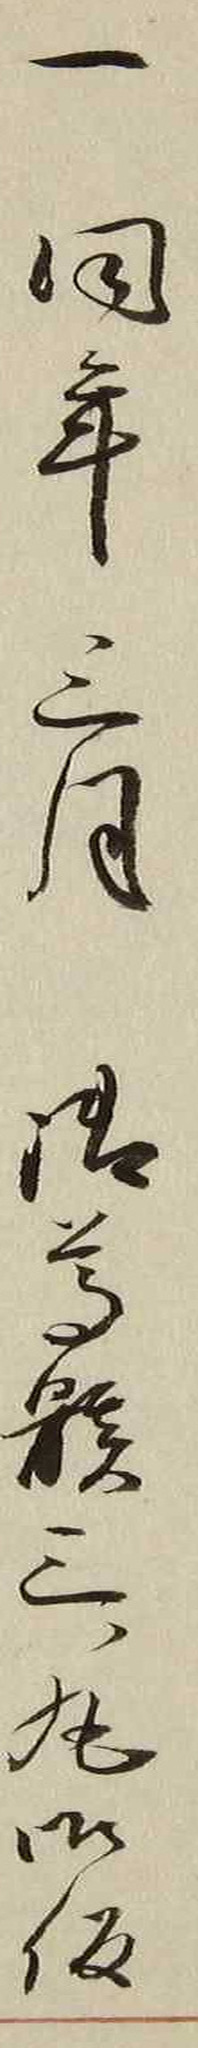一同年三月御尊骸三ノ丸御仮
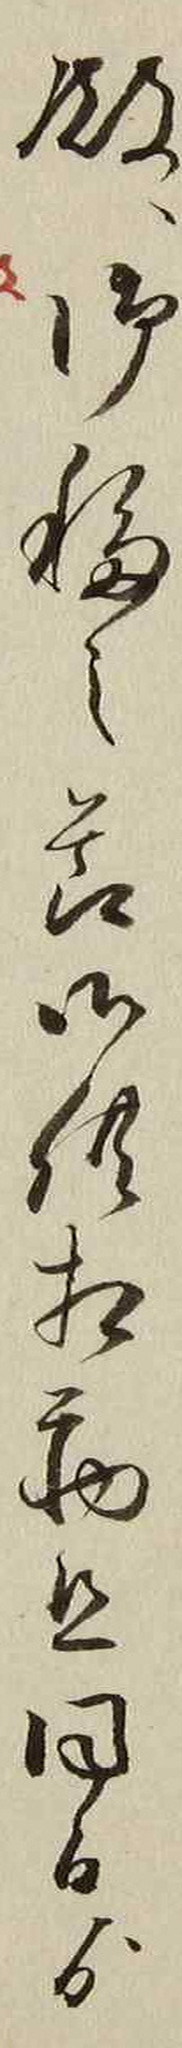殿へ御移の節御供相勤且同日ゟ
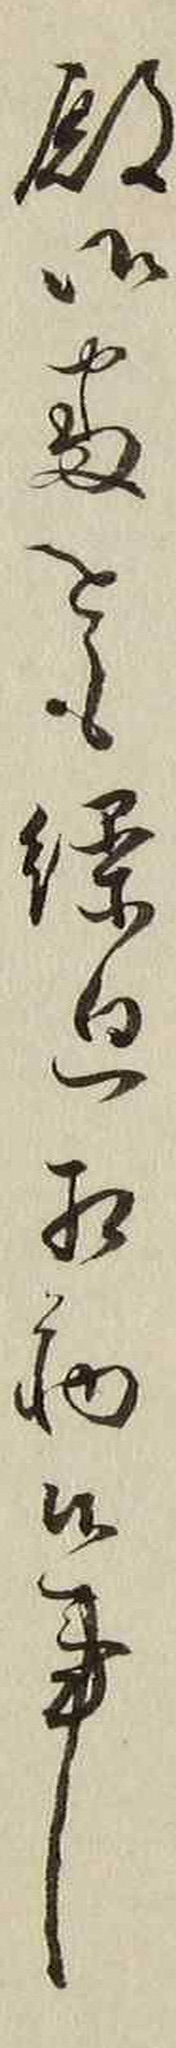殿御番をも繰廻相勤候事
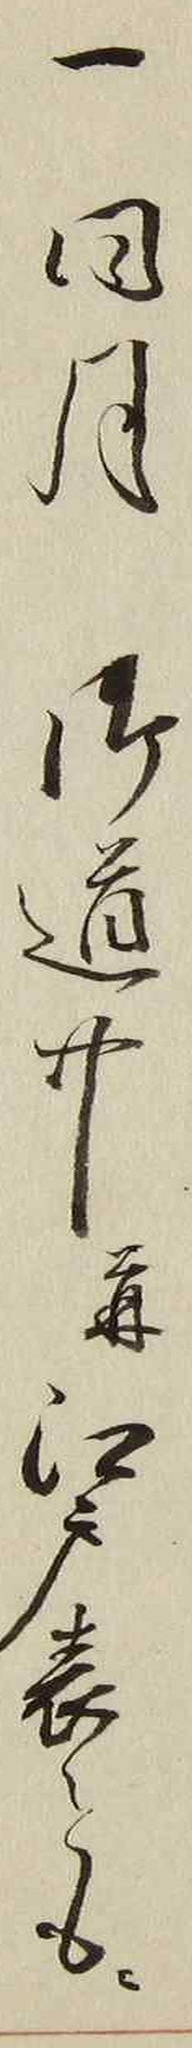一同月御道中并江戸表ともに
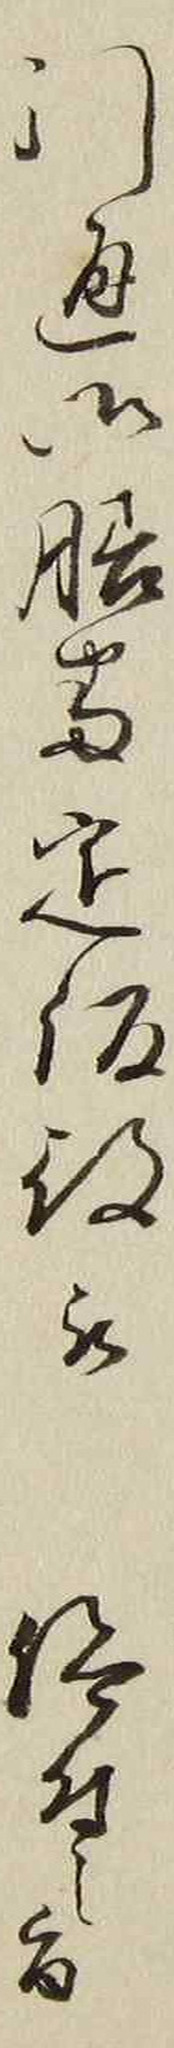引通御膳番定仮役被仰付の旨
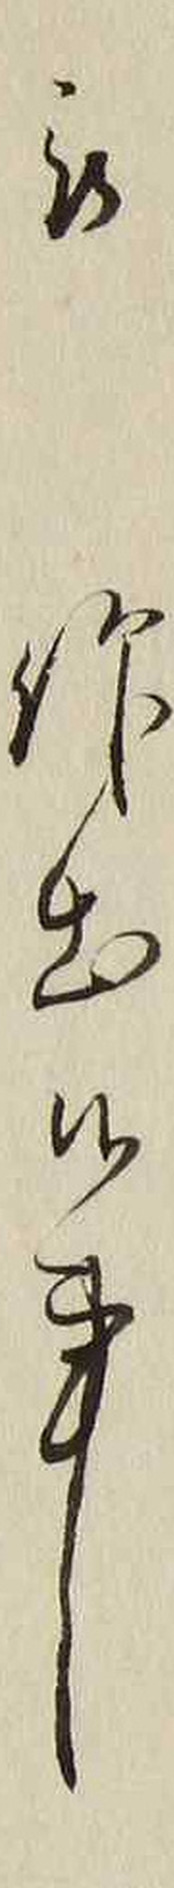被仰出候事
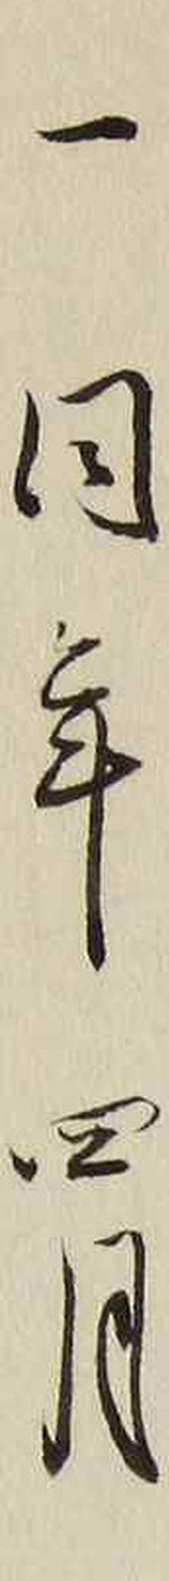一同年四月
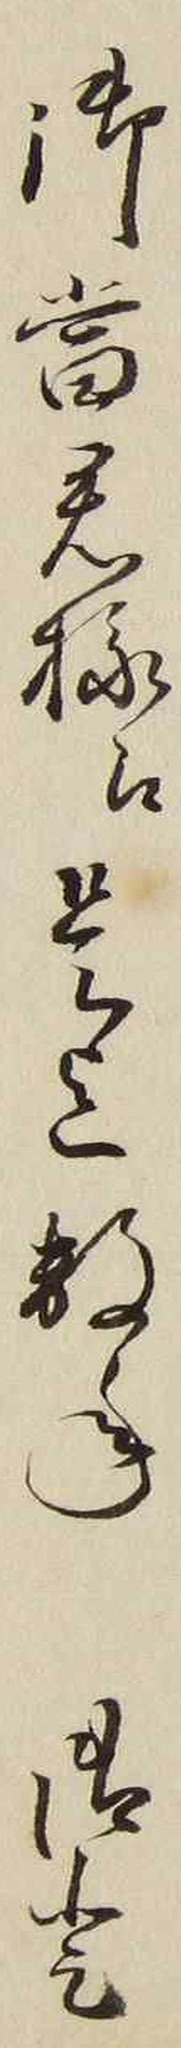御当君様え是迄数年御登

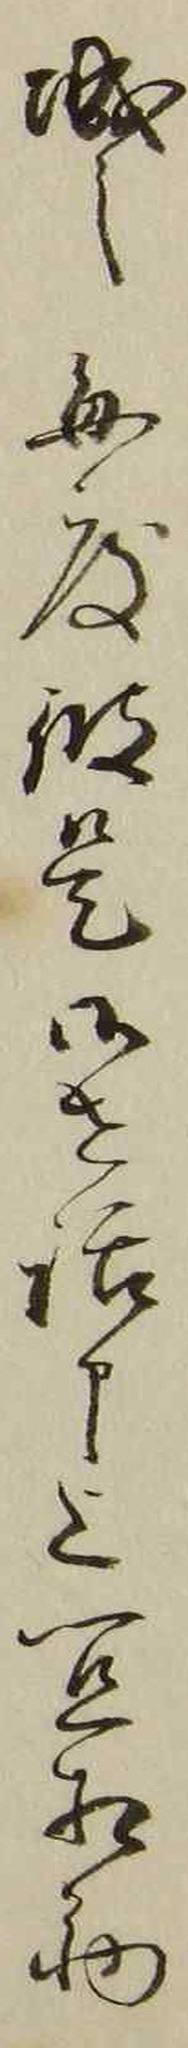城の毎度彼是御世話申上宜相勤
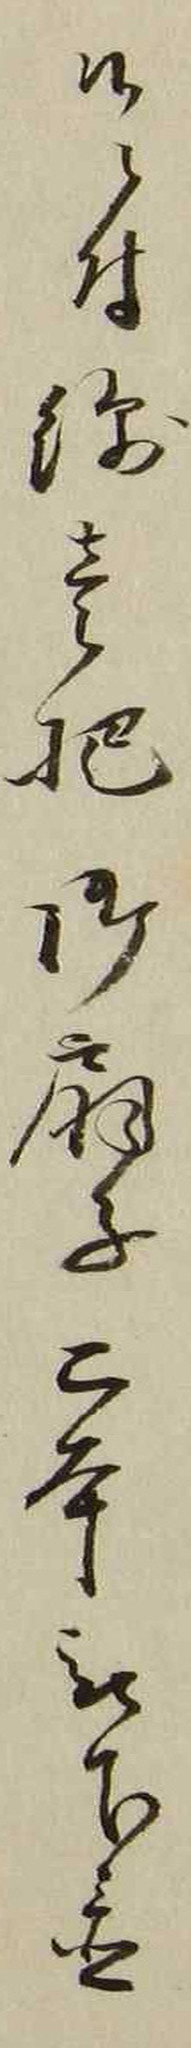候に付綿壱把御扇子二本被下置
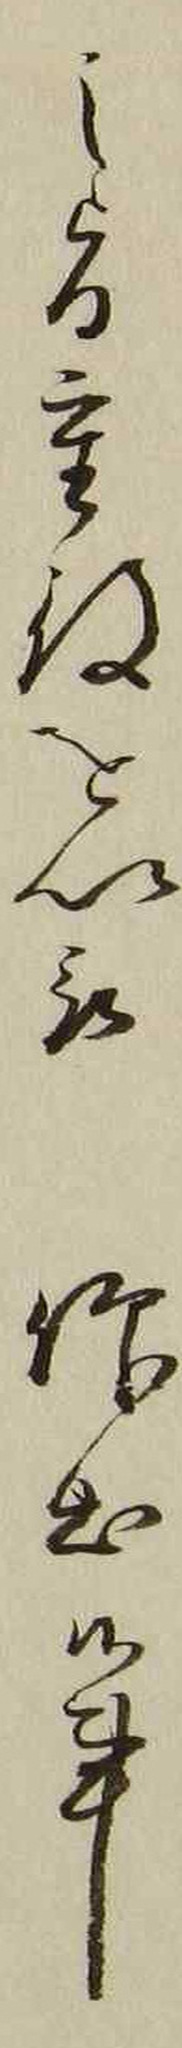の旨重役を以被仰出候事
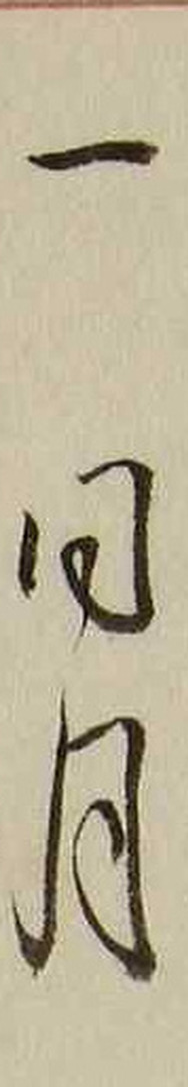一同月
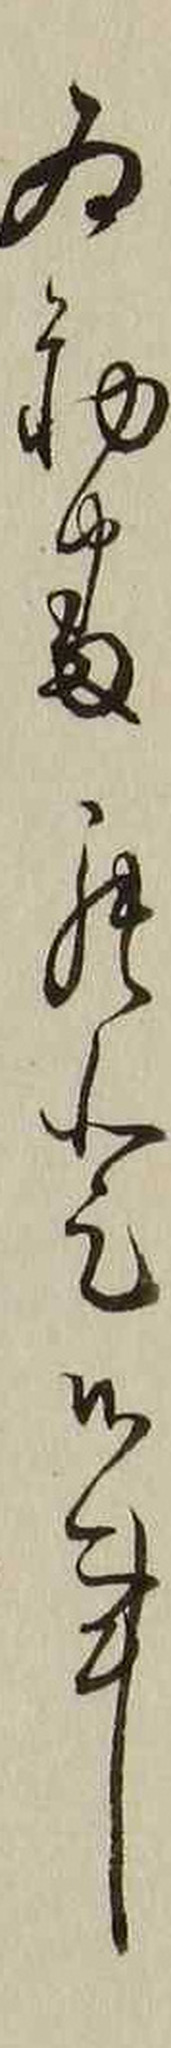為勤番罷登候事
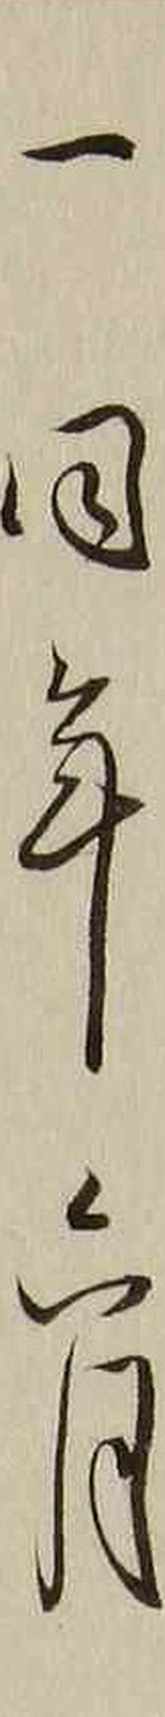一同年六月
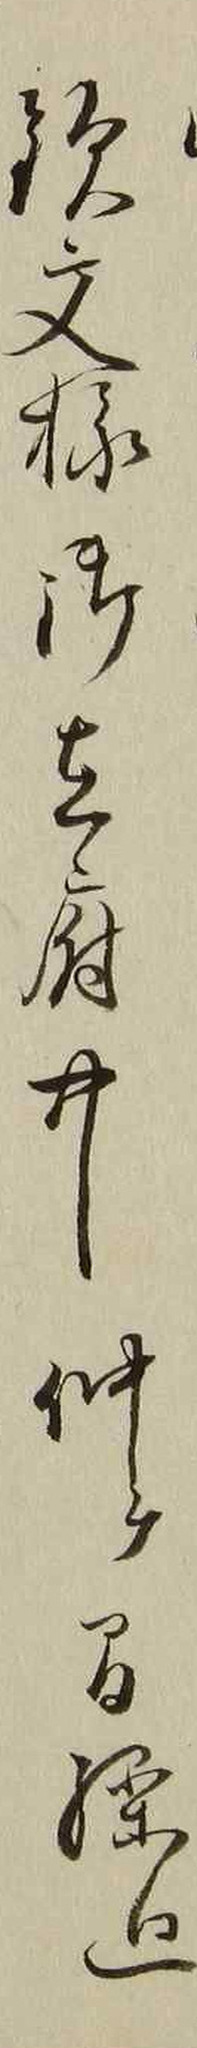欽文様御在府中仲ケ間繰廻
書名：諸士系譜　巻之1　い之部1
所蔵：会津若松市立会津図書館
